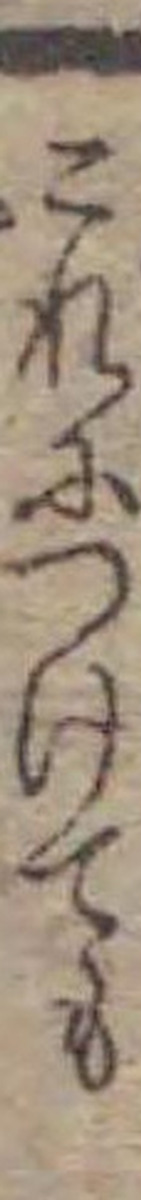これにつけても
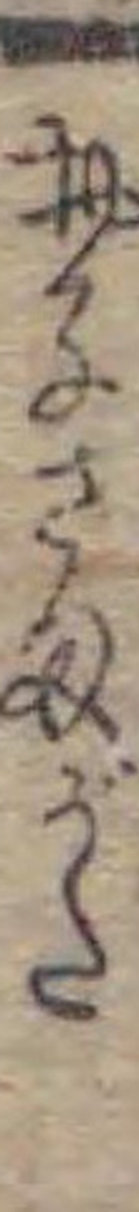お子さまがた
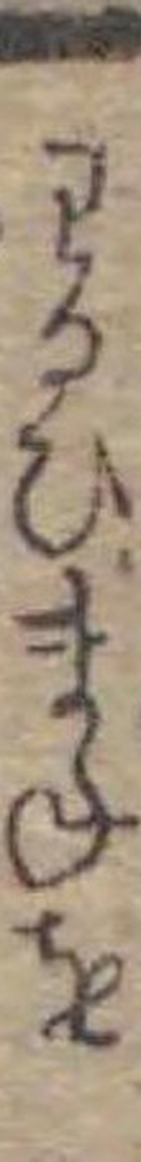わるひまねを
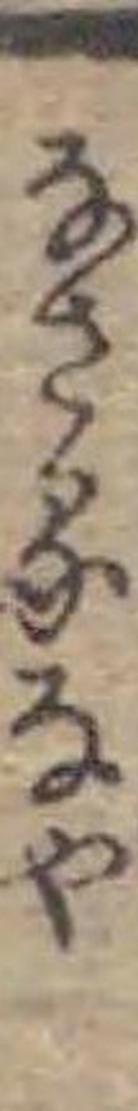なさるなや
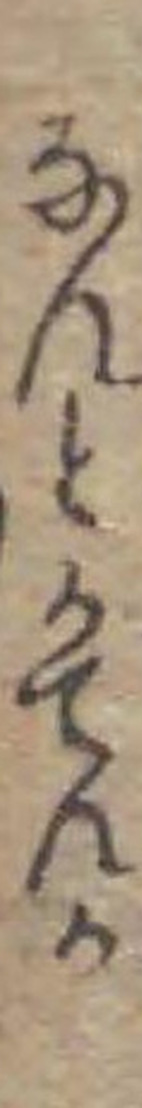なんとかてんか
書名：怪物つれつれ草 : 2巻
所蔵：国立国会図書館 National Diet Library, JAPAN
